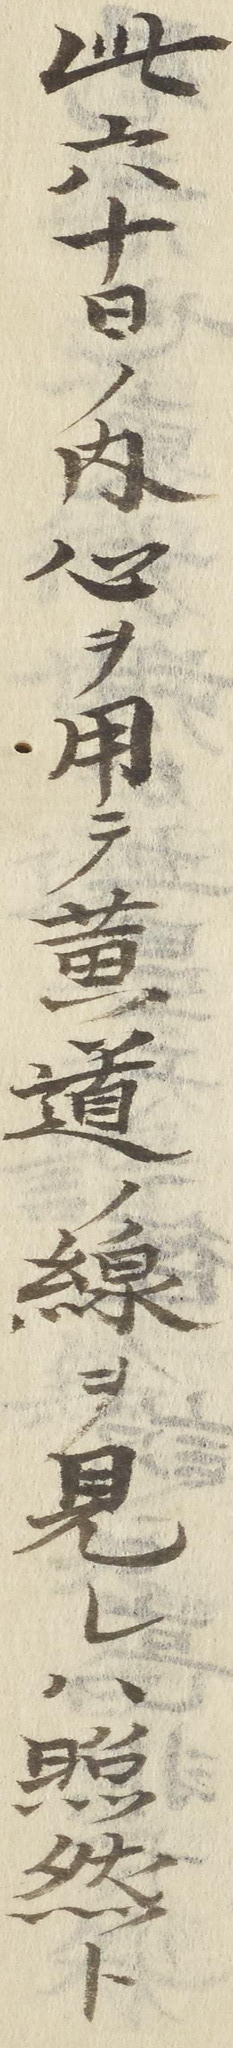此六十日ノ内心ヲ用テ黄道ノ線ヲ見レハ照然ト

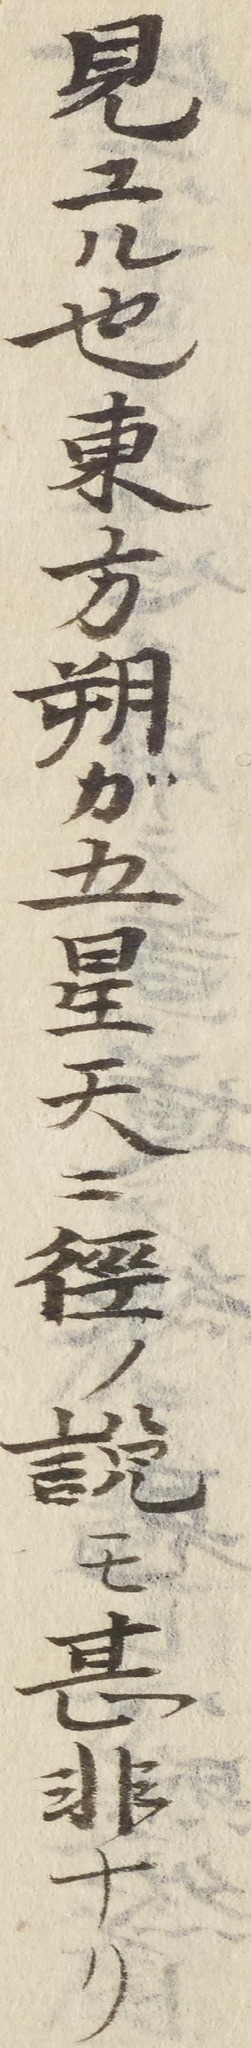見ユル也東方朔ガ五星天ニ径ノ説モ甚非ナリ
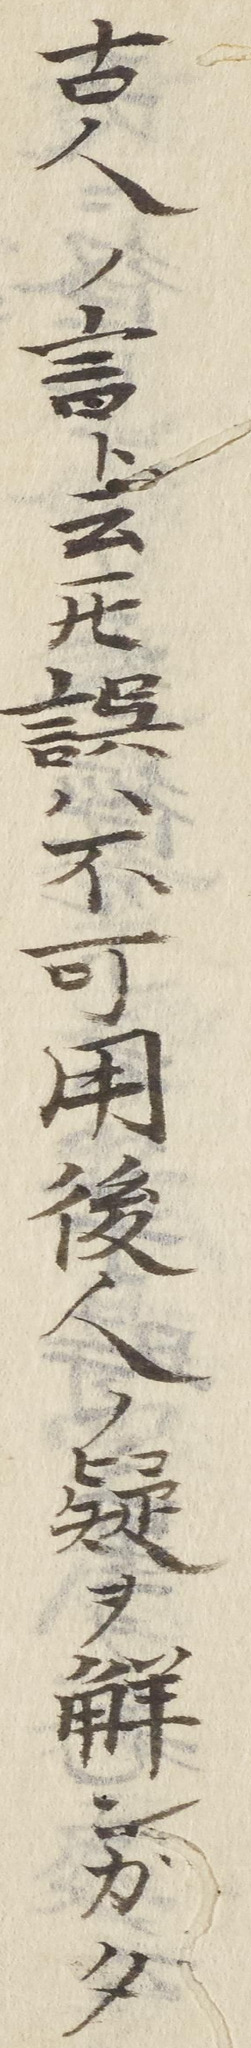古人ノ言ト云トモ誤ハ不可用後人ノ疑ヲ解ンガタ
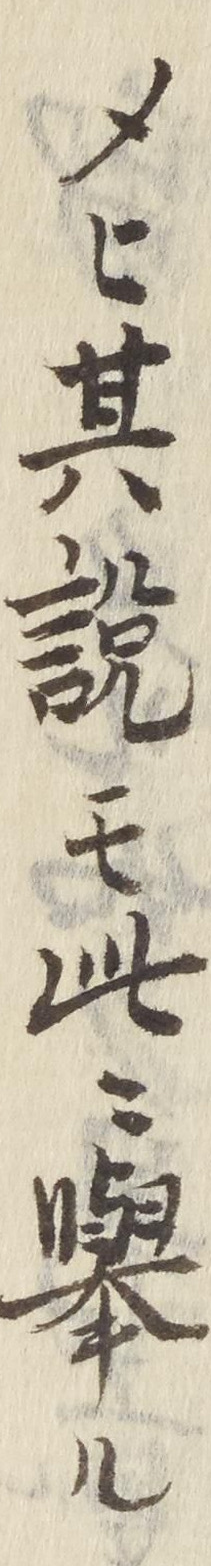メニ其説モ此ニ挙ル
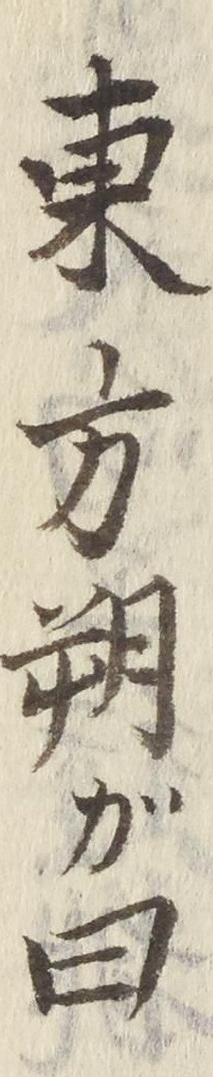東方朔ガ曰
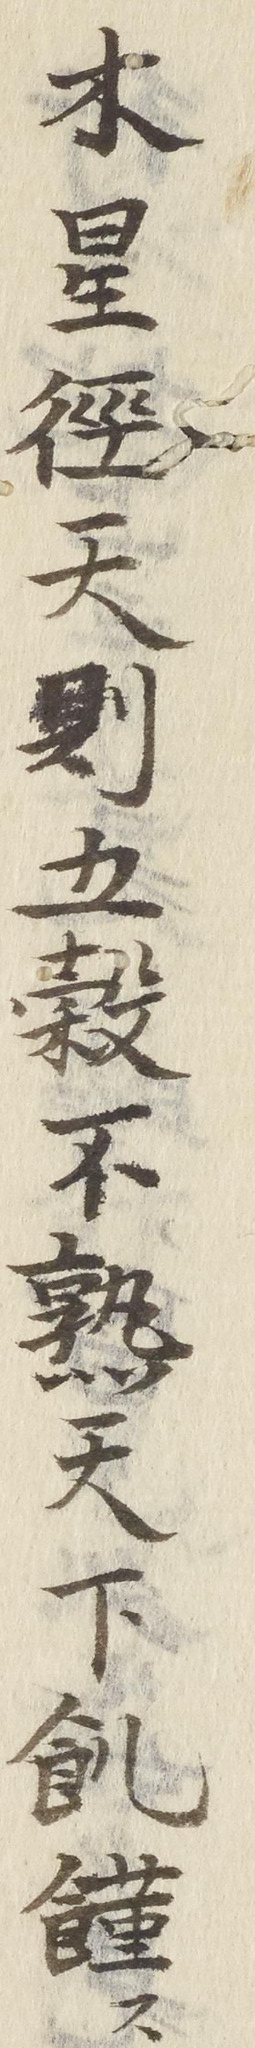木星径天則五穀不熟天下飢饉ス
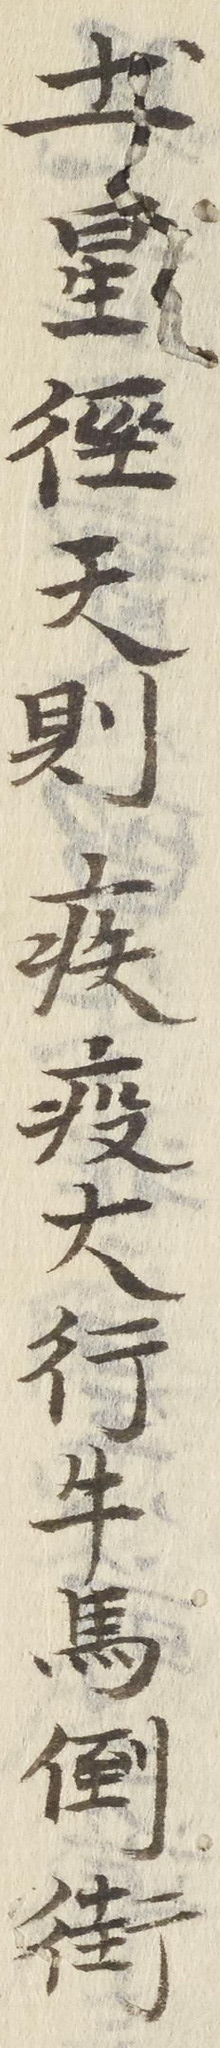土星径天則疾疫大行牛馬倒街
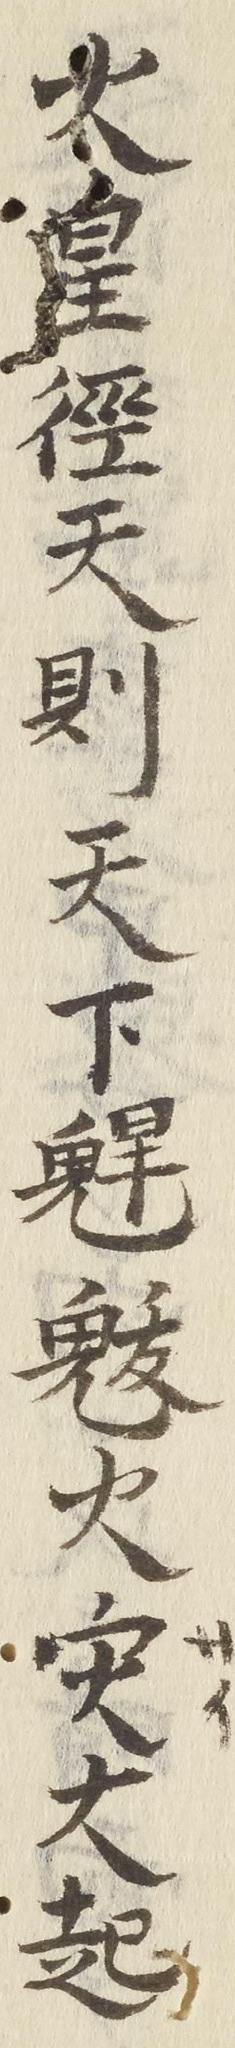火星径天則天下旱？魃火災大起
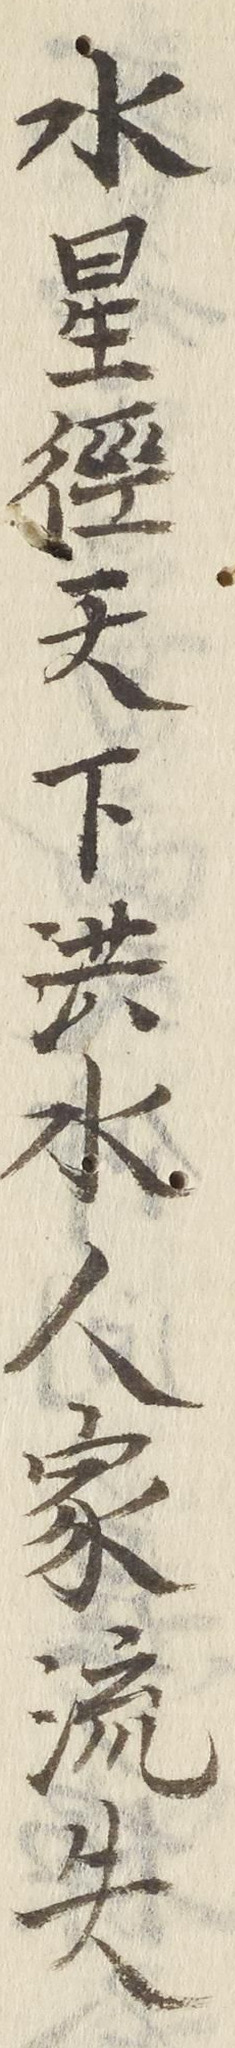水星径天下洪水人家流失
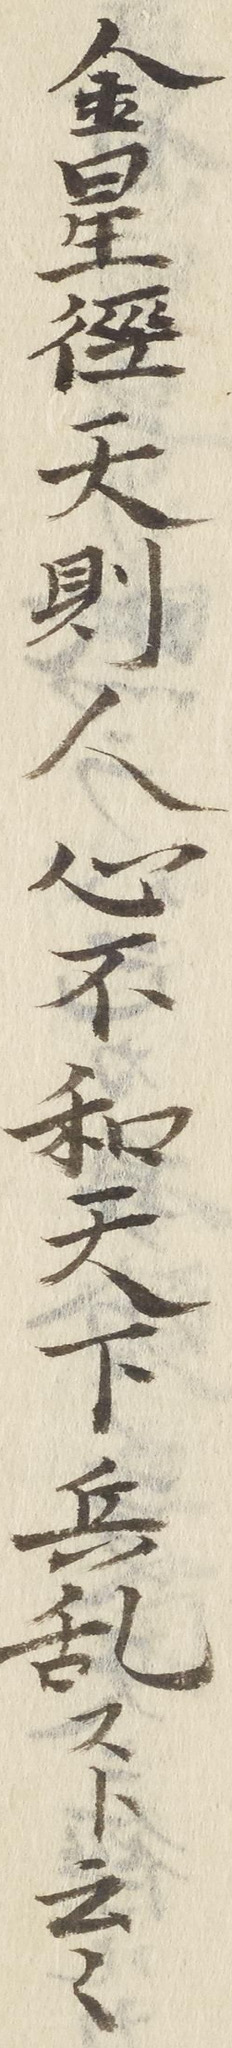金星径天則人心不和天下兵乱スト云々
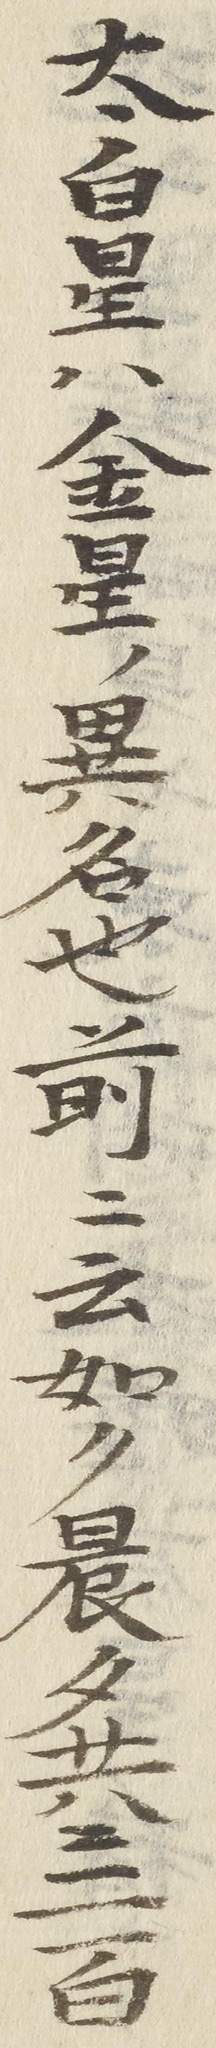太白星ハ金星ノ異名也前ニ云如ク晨夕共ニ二百
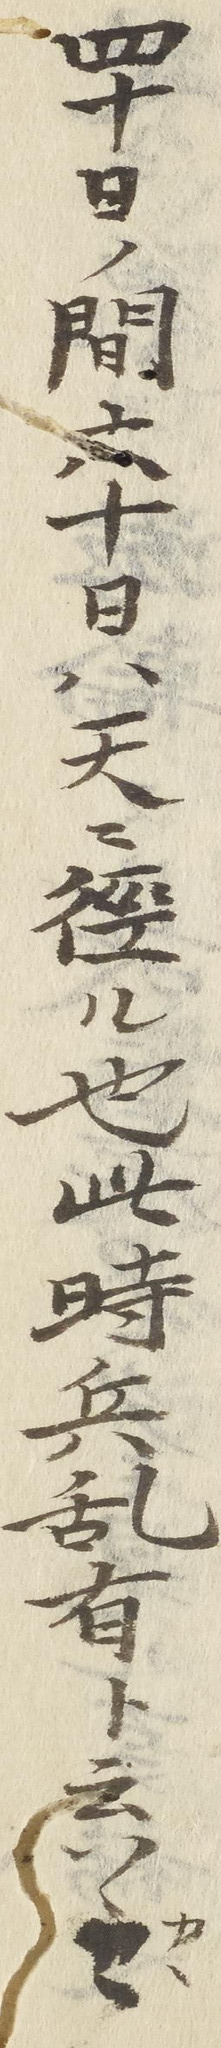四十日ノ間六十日ハ天ニ径ル也此時兵乱有ト云ハヽカヽ
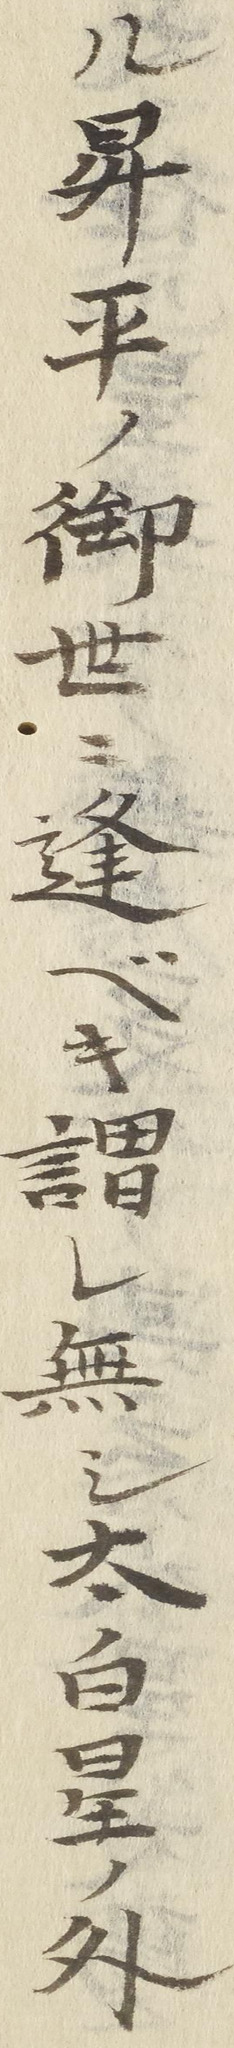ル昇平ノ御世ニ逢ベキ謂レ無シ太白星ノ外

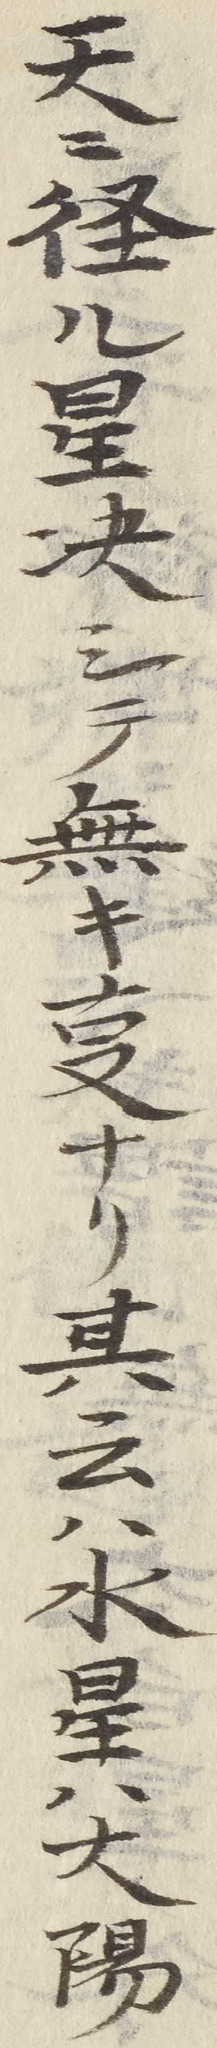天ニ径ル星決シテ無キ事ナリ其云ハ水星ハ大陽
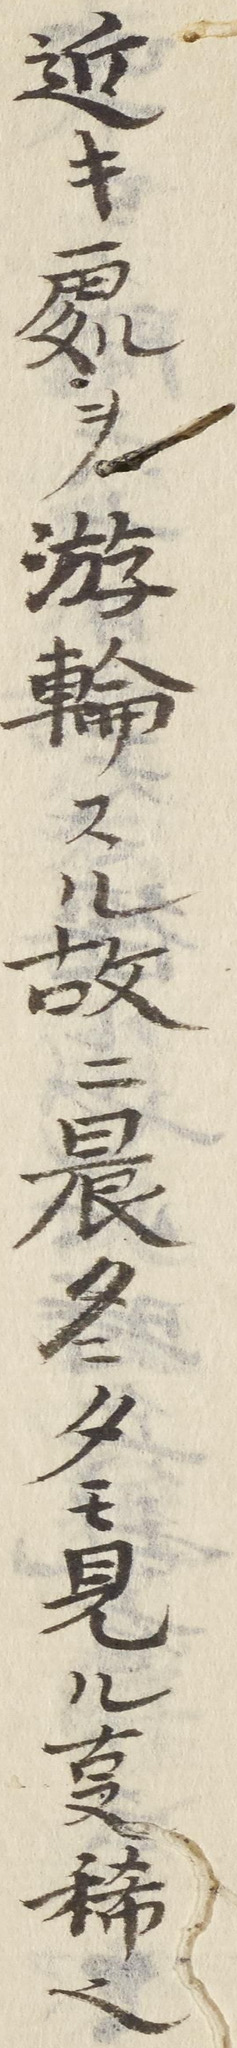近キ処ヲ游輪スル故ニ晨夕ニ夕モ見ル事稀也
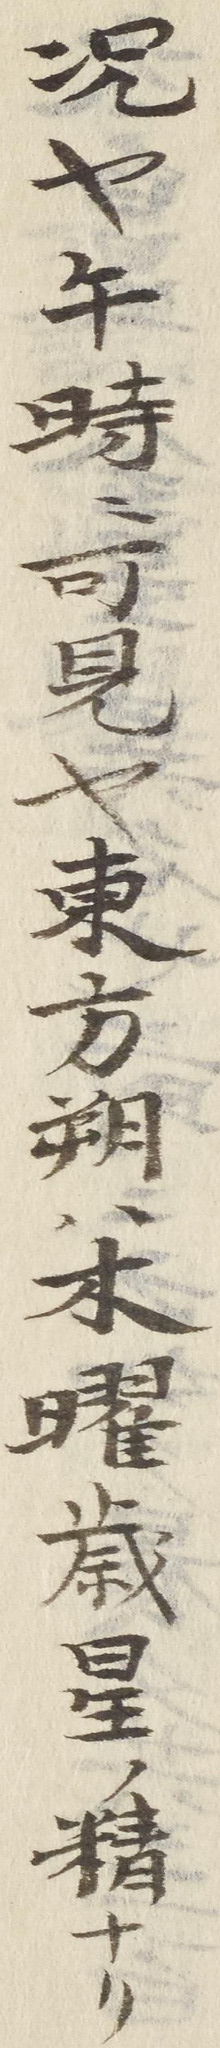況ヤ午時ニ可見ヤ東方朔ハ木曜歳星ノ精ナリ
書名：天象話説
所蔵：東京大学地震研究所図書室 Earthquake Research Institute Library, The University of Tokyo, JAPAN
